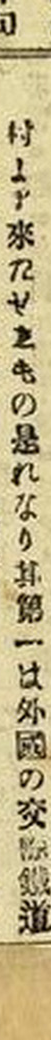村より来たせしもの是れなり其第一は外国の交際鉄道
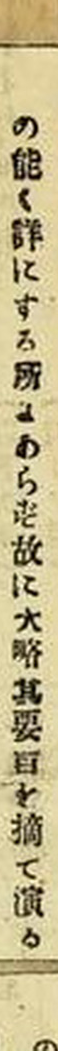の能く詳にする所にあらず故に大略其要旨を摘て演る
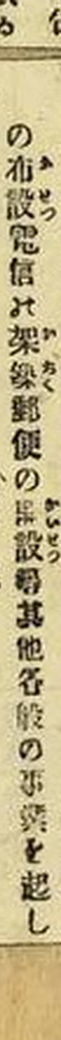の布設電信の架築郵便の開設等其他各般の事業を起し
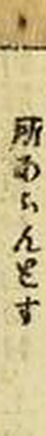所あらんとす
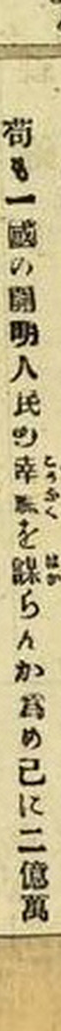苟も一国の開明人民の幸福を謀らんか為め已に二億万
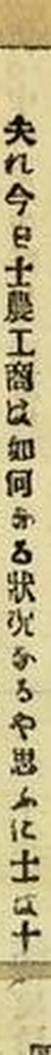夫れ今日士農工商は如何なる状況なるや思ふに士は十
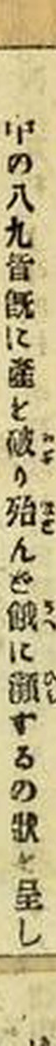中の八九皆既に産を破り殆んど餓に瀕するの状を呈し
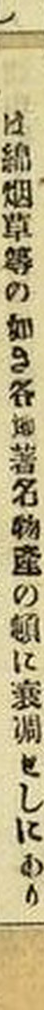は綿煙草等の如き各地著名物産の頓に衰凋せしにあり
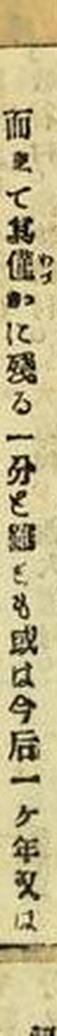而して其僅かに残る一分と雖とも或は今后一ケ年又は
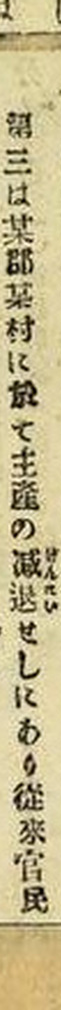第三は其郡其村に於て生産の減退せしにあり従来官民
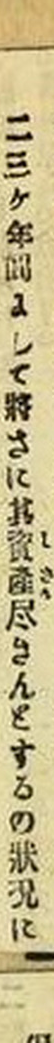二三ケ年間にして将さに其資産尽きんとするの状況に
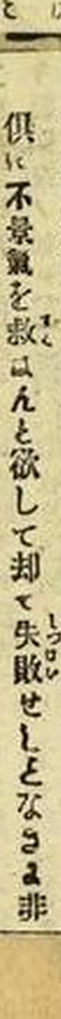俱に不景気を救はんと欲して却て失敗せしことなきに非
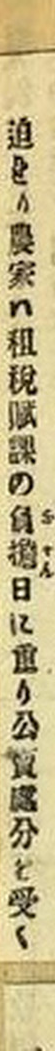迫れり農家は租税賦課の負担日に重り公売処分を受く
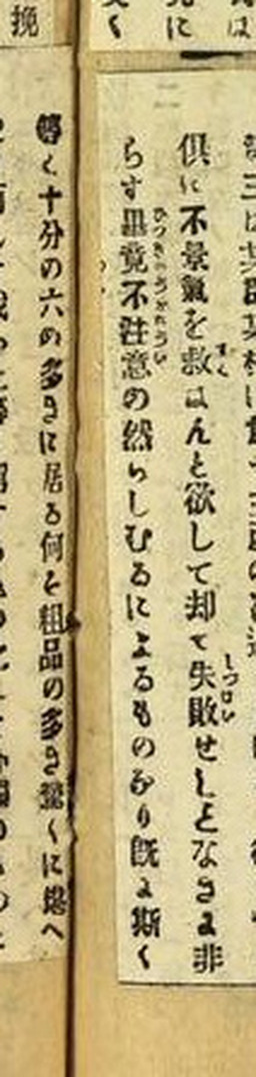らす畢竟不注意の然らしむるによるものなり既に斯く
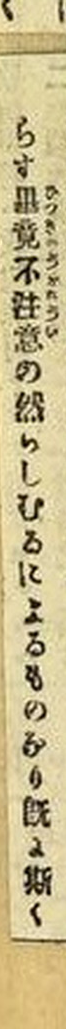らす畢竟不注意の然らしむるによるものなり既に斯く
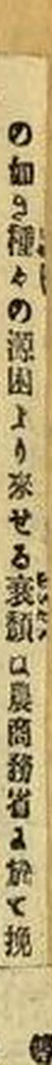の如き種々の源因より来せる衰頽は農商務省に於て挽
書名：温古集 五巻
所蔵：福井県文書館 Fukui Prefectural Archives
